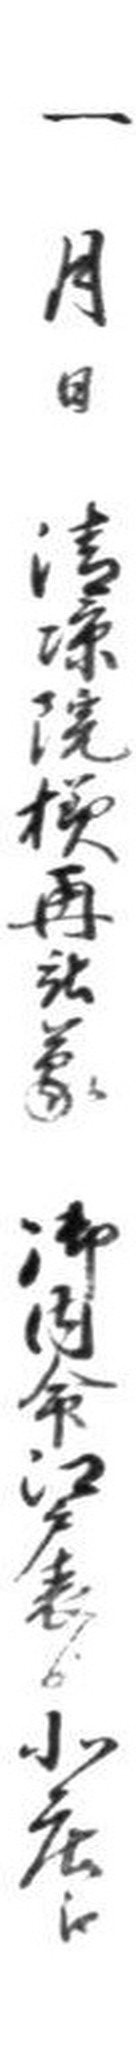一月日清涼院様再被蒙御内命江戸表ゟ北庄江
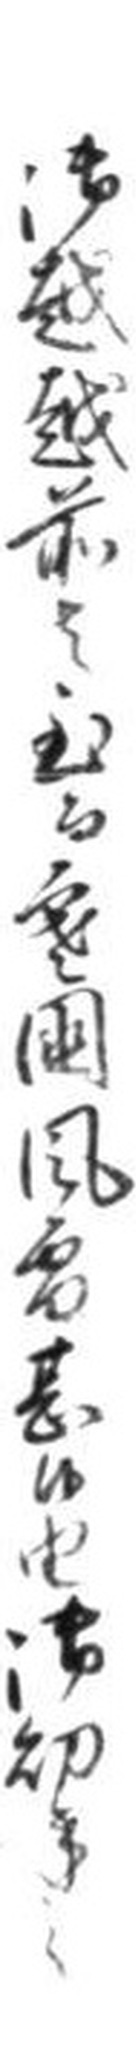御越越前者至而寒国風雪甚候由御幼年之
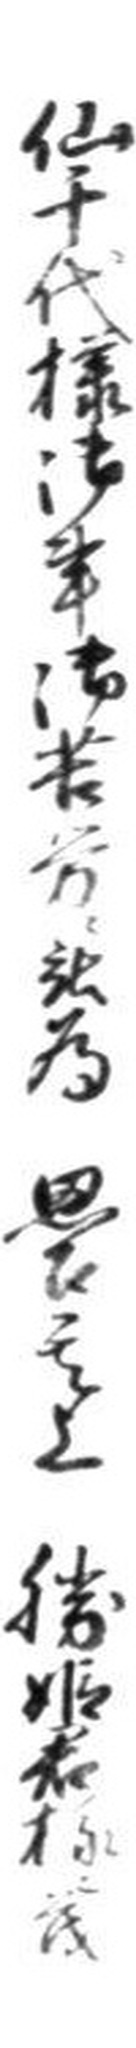仙千代様御事御苦労ニ被為思召其上勝姫君様ニ茂
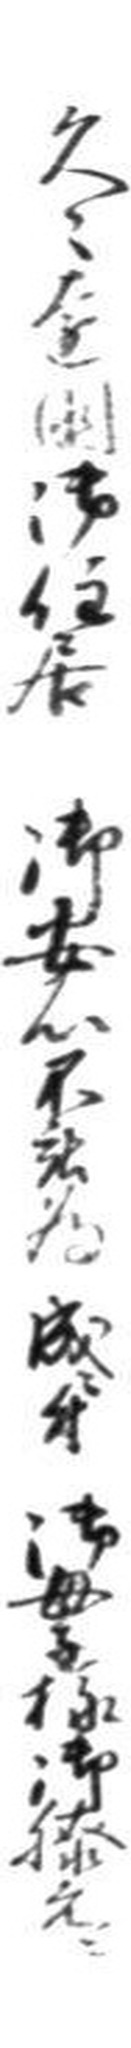久々遠国御住居御安心不被為成ニ付御母子様御膝元ニ
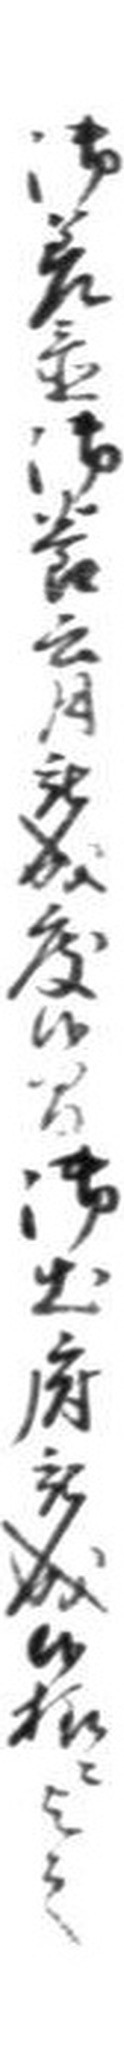御差置御養育被成度候間御出府被成候様ニ与之
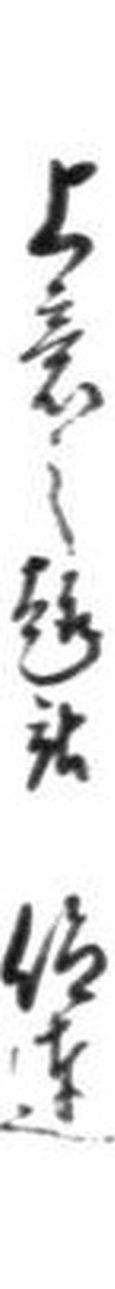上意之趣被仰達
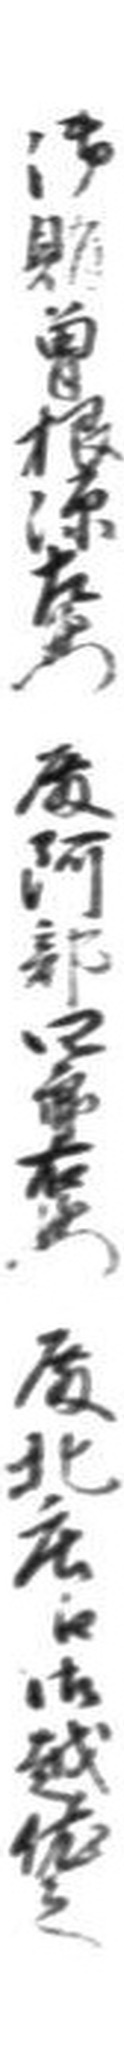御賄曽根源左衛門殿阿部四郎右衛門殿北庄江御越依之
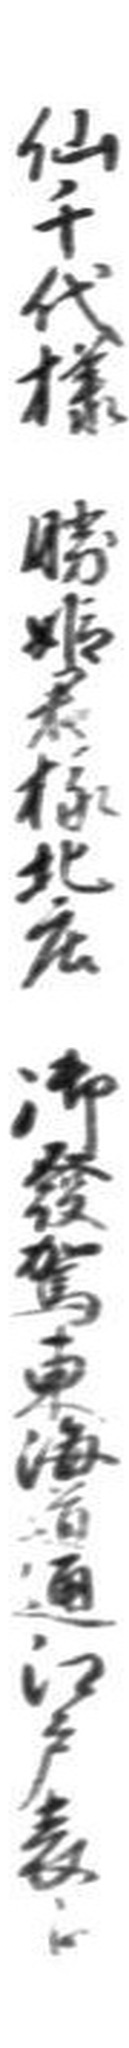仙千代様勝姫君様北庄御発駕東海道通江戸表江
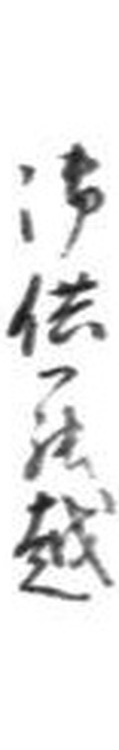御供罷越
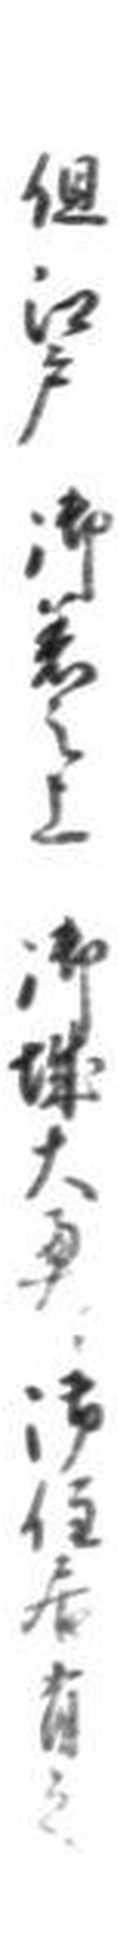但江戸御着之上御城大奥御住居有之
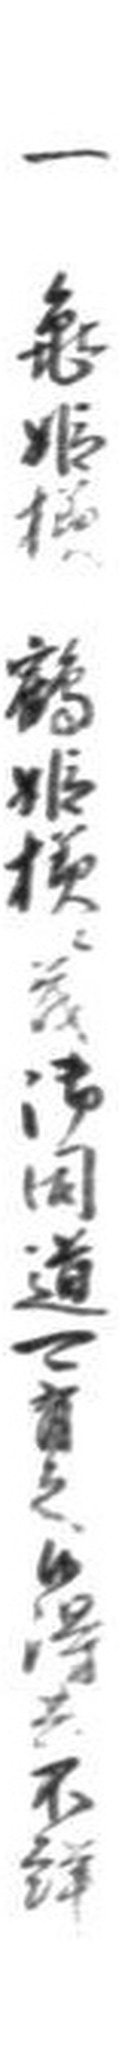一亀姫様鶴姫様ニ茂御同道可有之候得共不詳

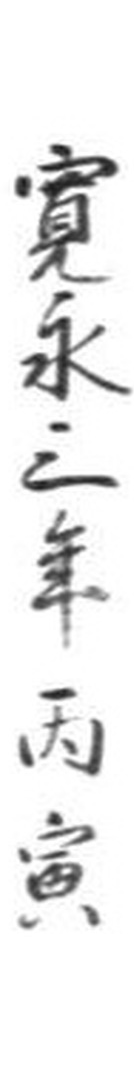寛永三年丙寅
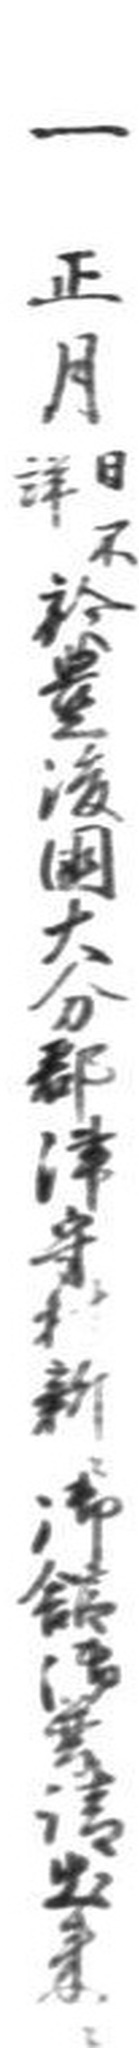詳於豊後国大分郡津守村新ニ御館御普請出来ニ付
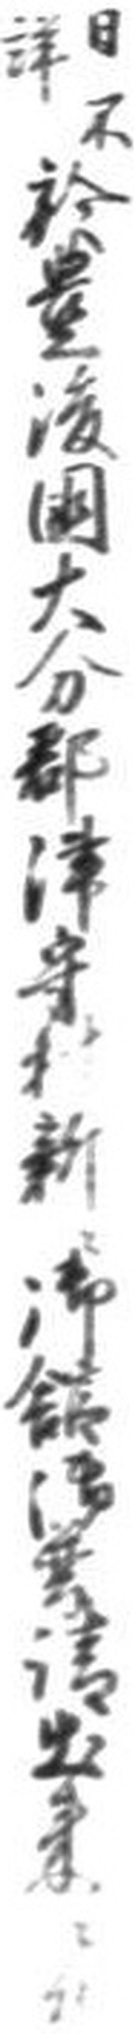詳於豊後国大分郡津守村新ニ御館御普請出来ニ付
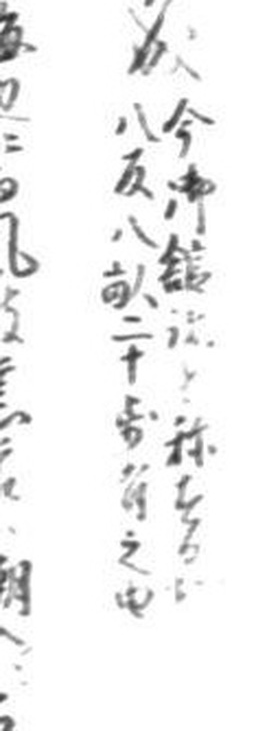八反八畝二十歩有之由
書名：家譜 二 忠直公 従文禄四年到慶安四年
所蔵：福井県文書館 Fukui Prefectural Archives
